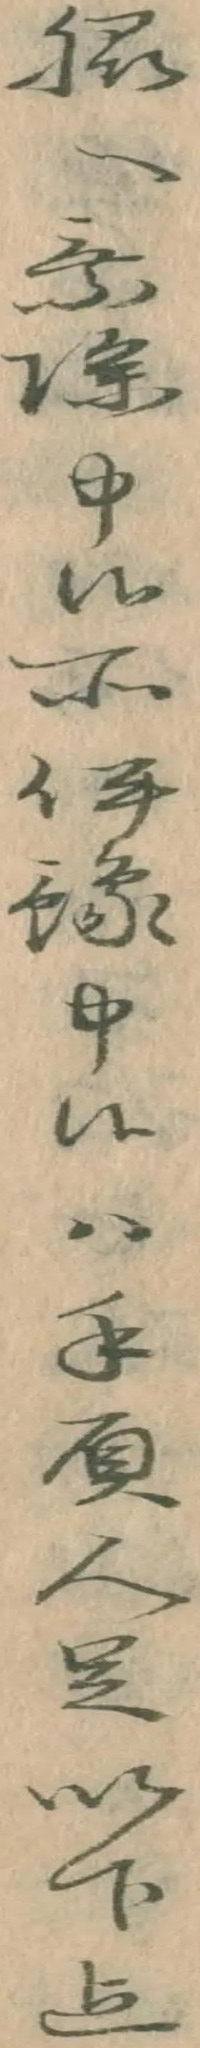脇へ乗除申候所伊予申候は手負人足以下迄

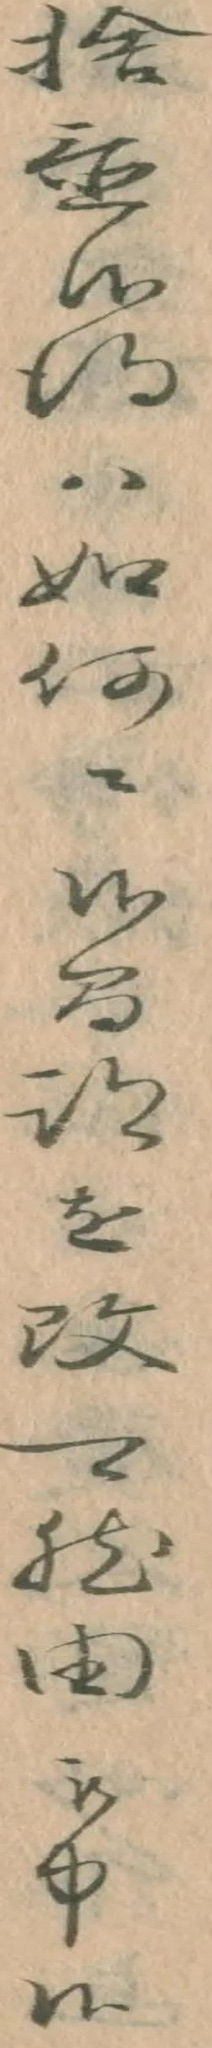捨置候得は如何に候間跡を改可然由被申候
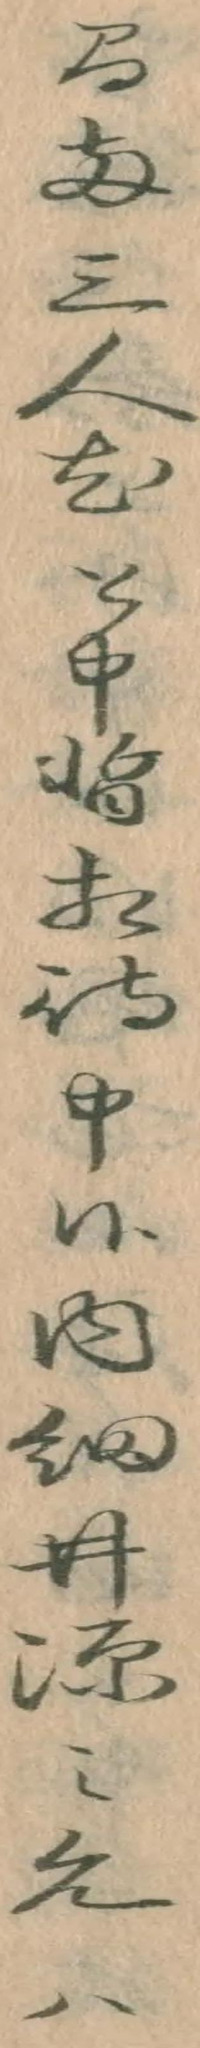間両三人尤と申暫相待申候内細井源之允は
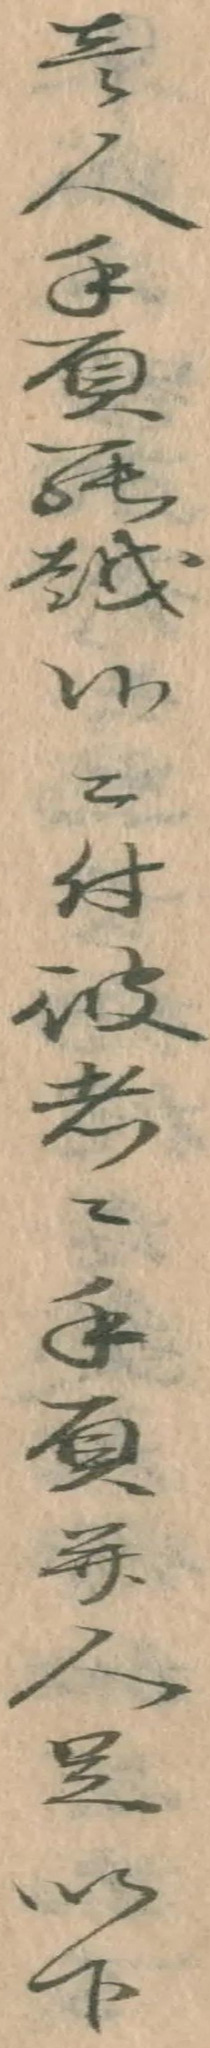壱人手負罷越候に付彼者に手負幷人足以下
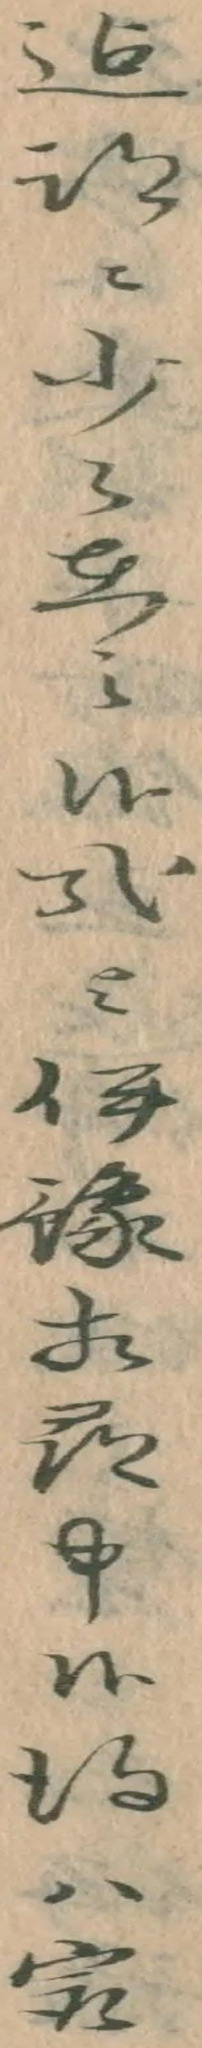迄跡に少々在之候哉与伊予相尋申候得は最
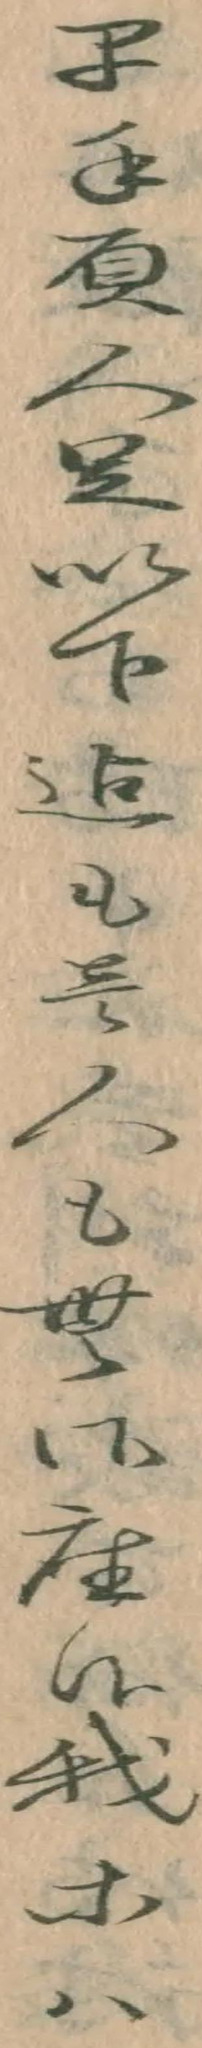早手負人足以下迄も壱人も無御座候我等は
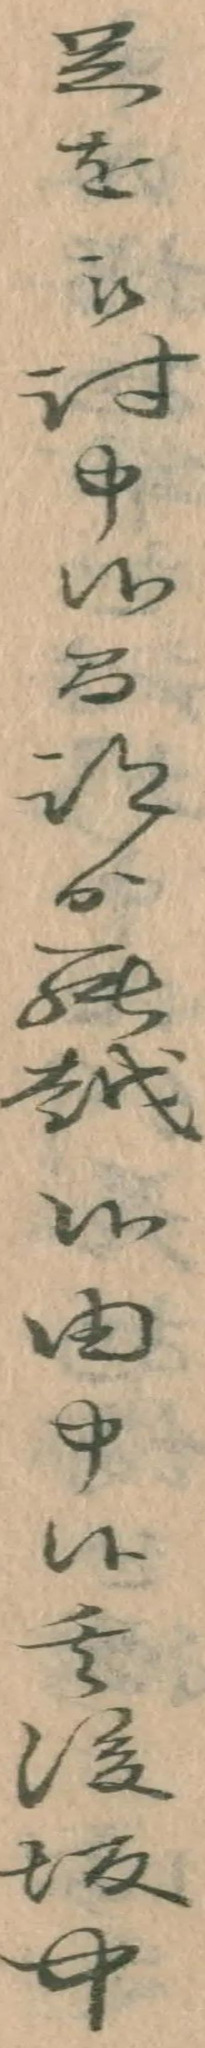足を被討申候間跡ゟ罷越候由申候其後坂中
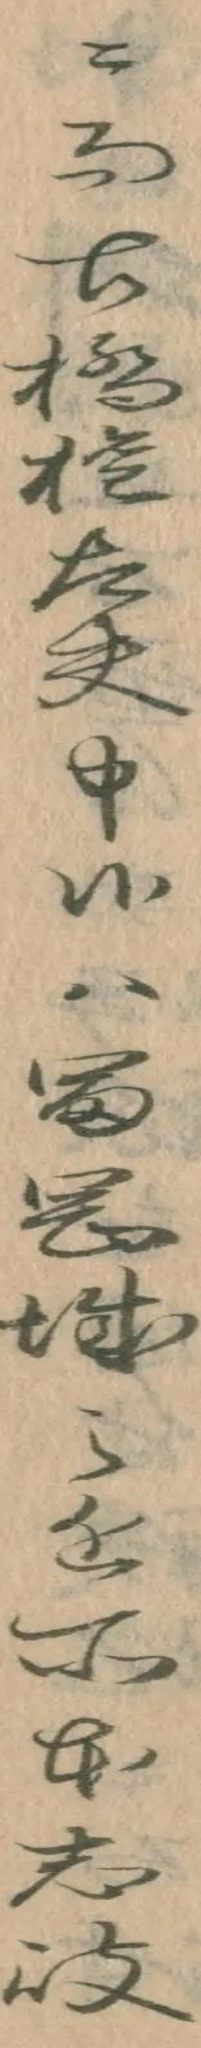に而古橋権太夫申候は冨岡城之近所本志岐
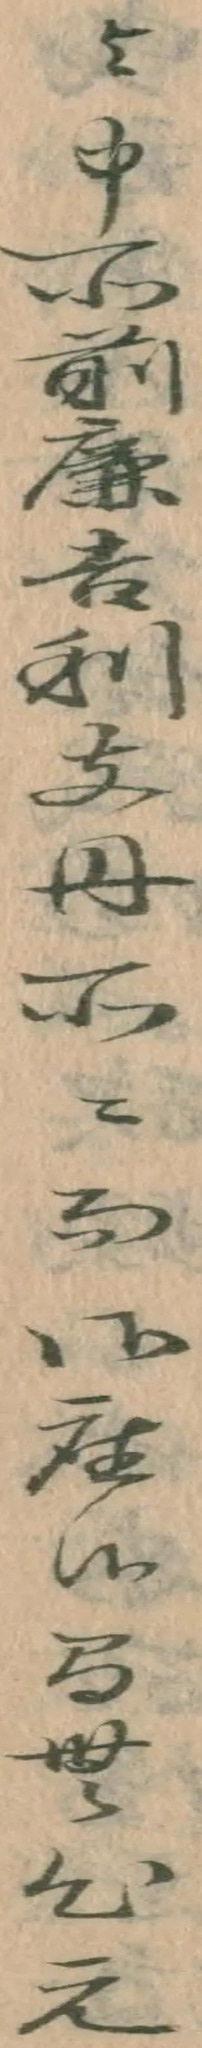与申所前廉吉利支丹所に而御座候間無心元
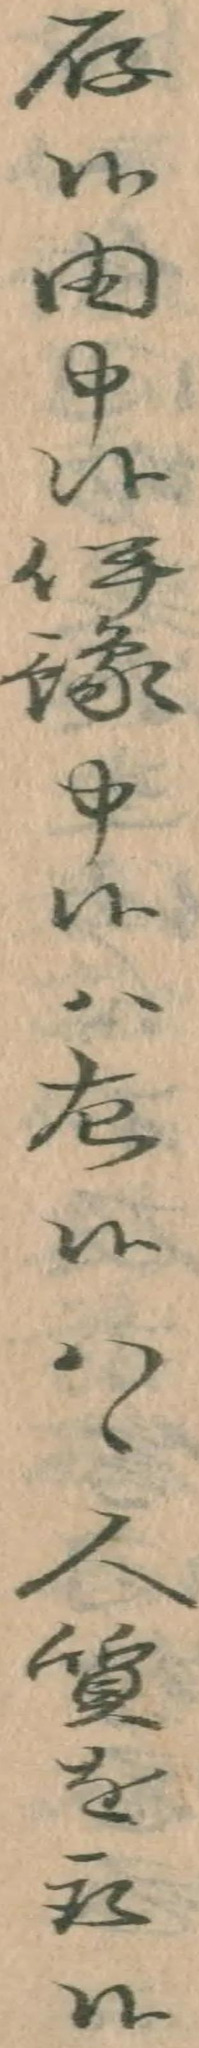存候由申候伊予申候は左候はゝ人質を取候
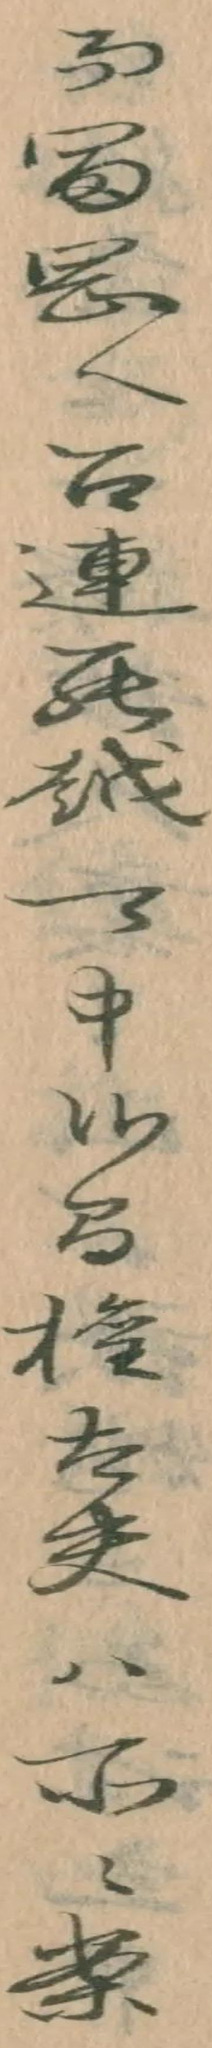而冨岡へ召連罷越可申候間権太夫は所々案
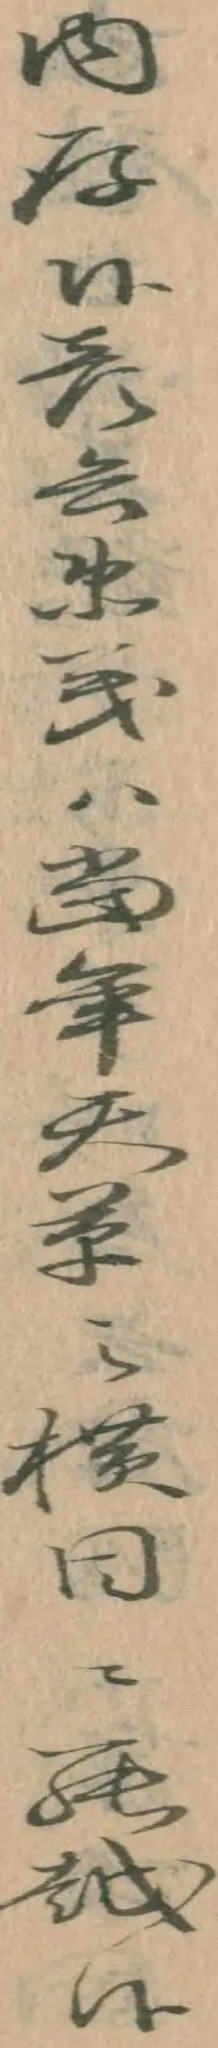内存候彦兵衛義は当年天草之横目に罷越候
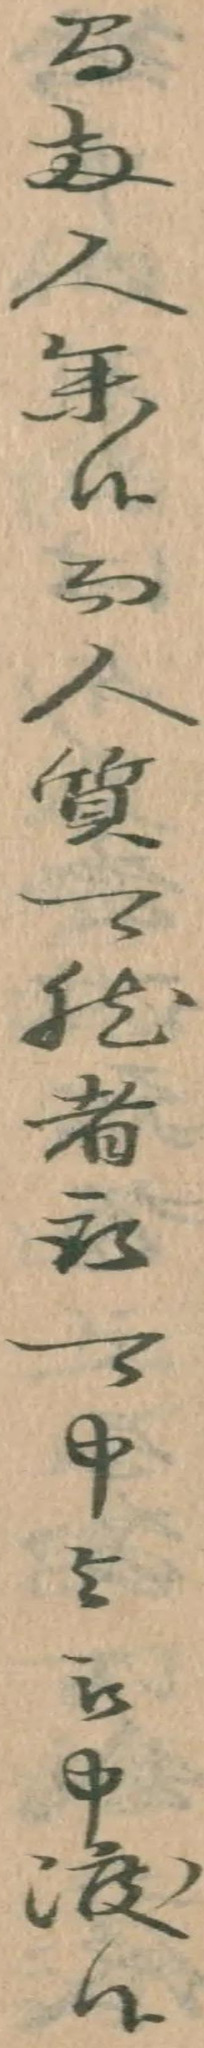間両人参候而人質可然者取可申与被申渡候
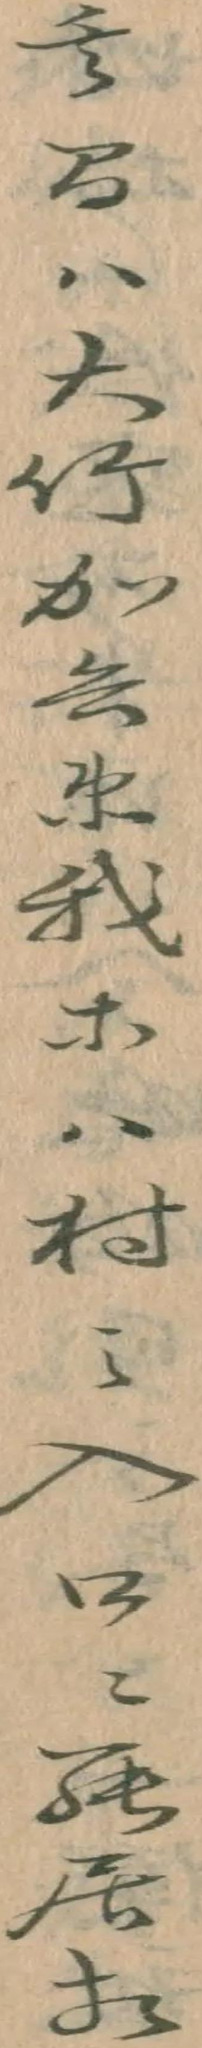其間は大竹加兵衛我等は村之入口に罷居相
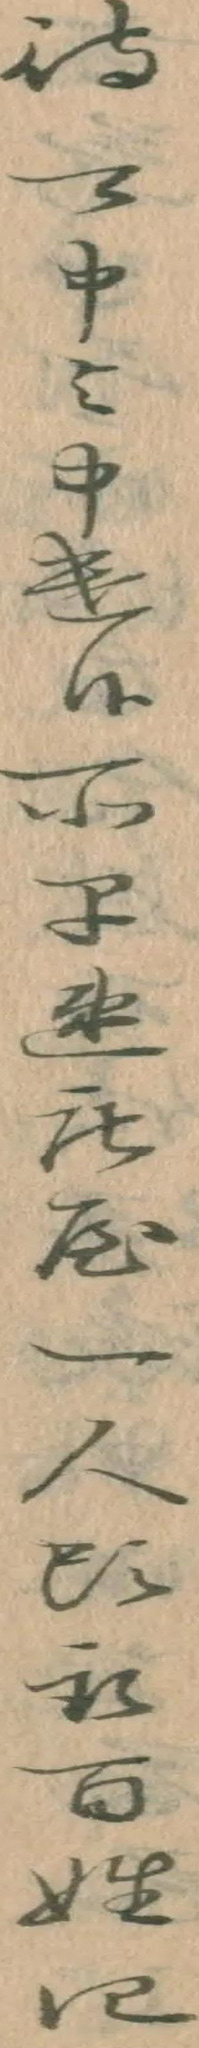待可申与申遣候所早速庄屋一人頭取百姓四
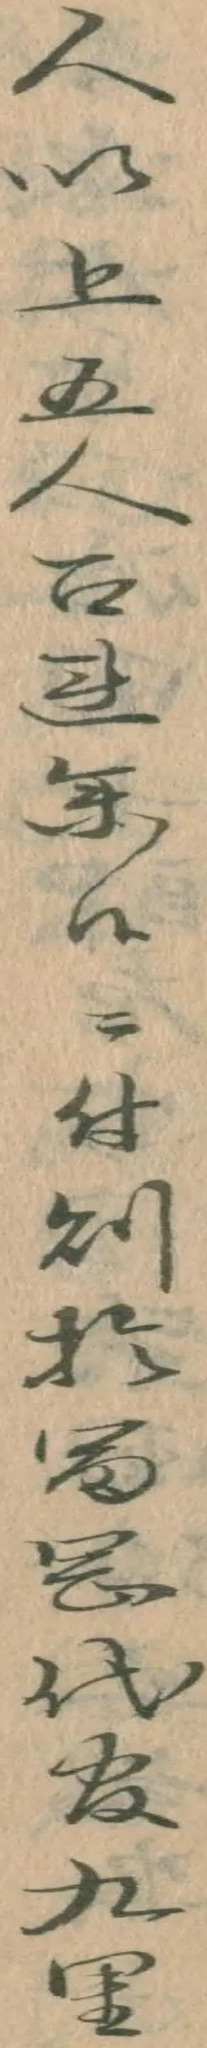人以上五人召連参候に付則於冨岡代官九里
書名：切支丹御退治記 49巻. [2]
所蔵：国立国会図書館 National Diet Library, JAPAN
